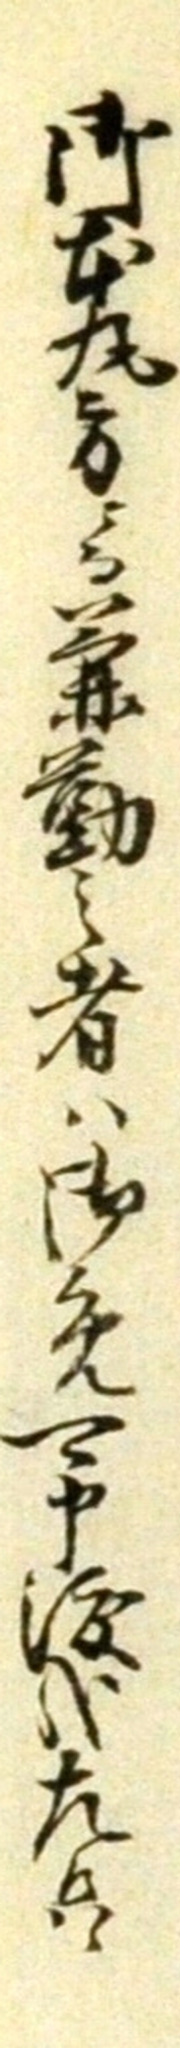御本丸方ニ而兼勤之者ハ御免可申渡哉左候ハゞ
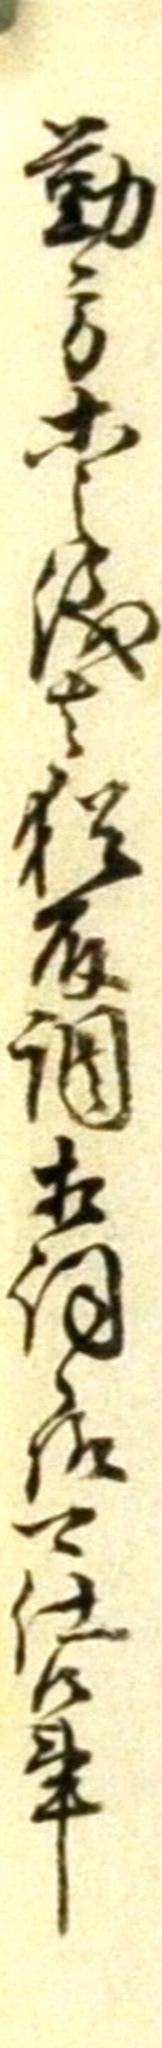勤方等之儀者猶取調相伺候様可仕候事

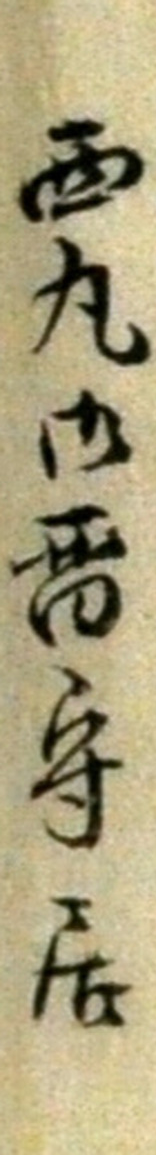西丸御番守居
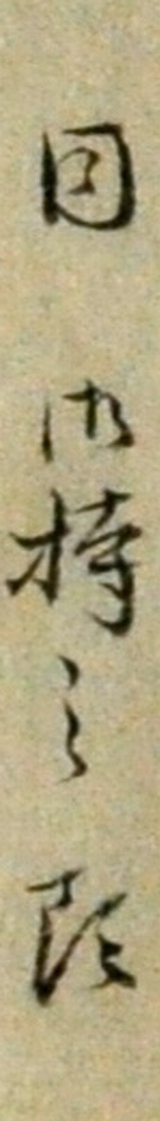同御持之頭
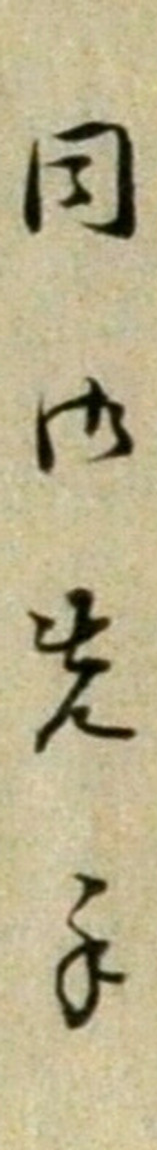同御先手
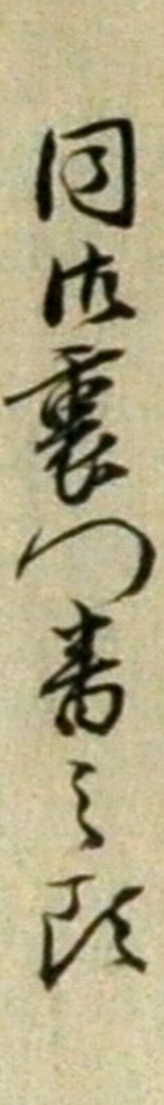同御裏門番之頭
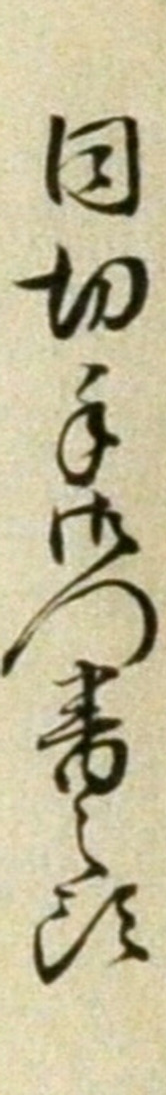同切手御門番之頭
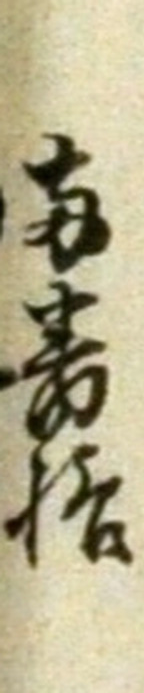両番格
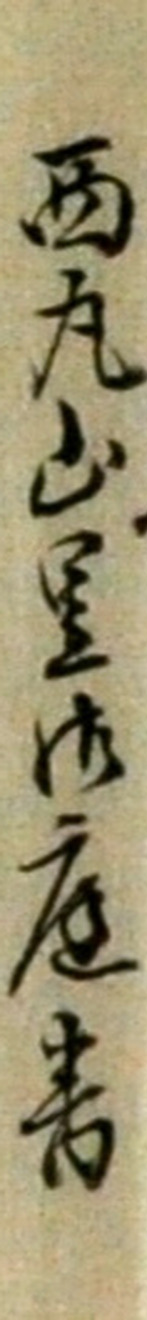西丸山里御庭番
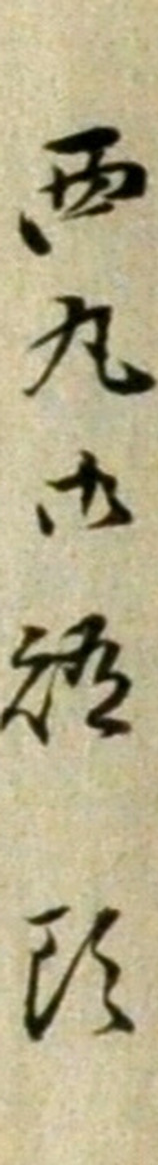西丸御賄頭
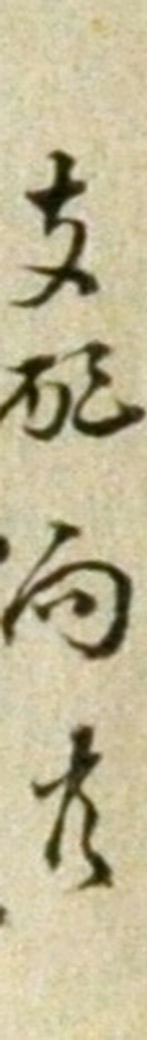支配向共
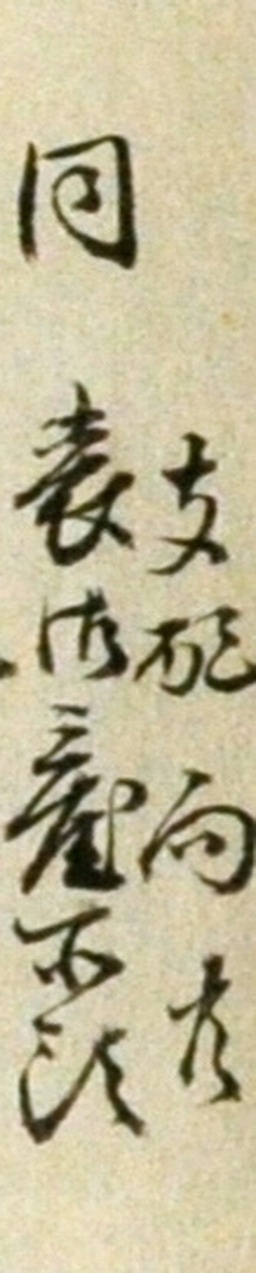同表御臺所頭
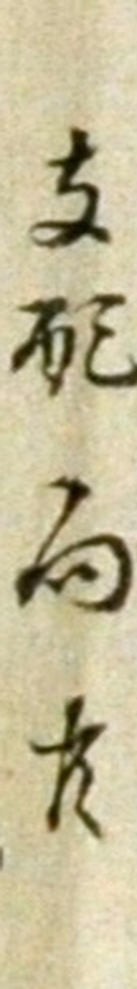支配向共
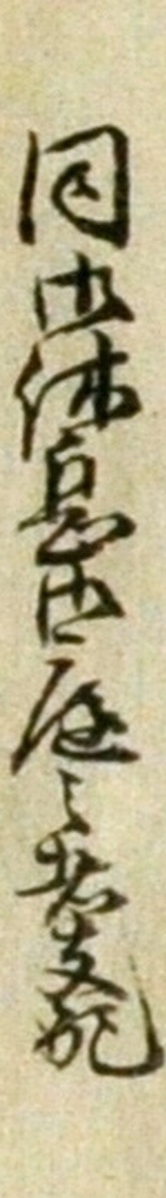同御休息御庭之者支配
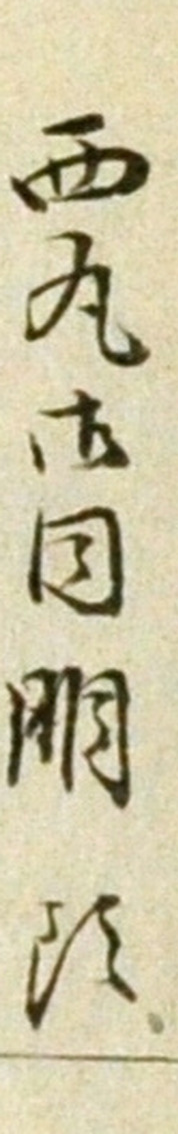西丸御同朋頭
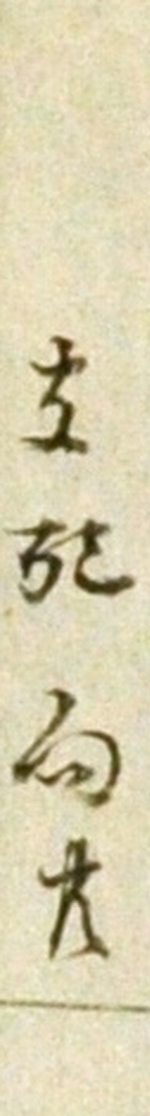支配向共
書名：若年寄御役中御調書付
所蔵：伊那市立高遠町図書館・合同会社AMANE
